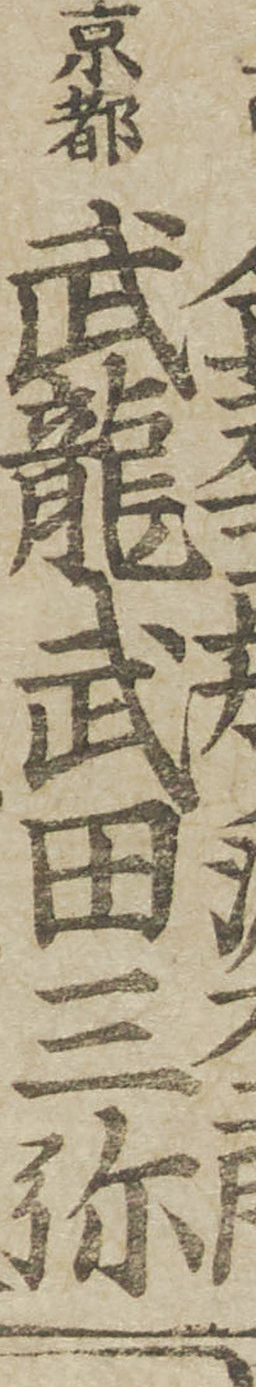同京都武龍武田三弥
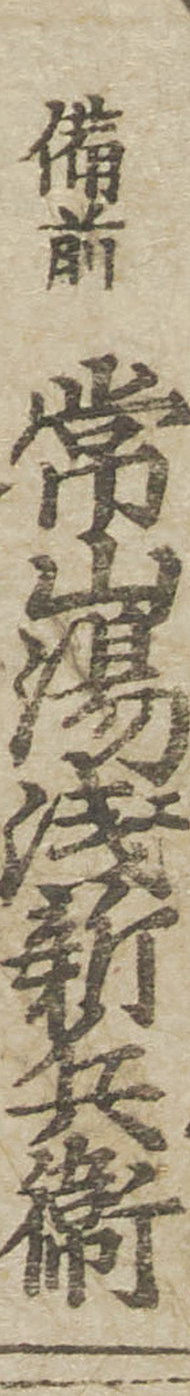同備前常山湯浅新兵衛
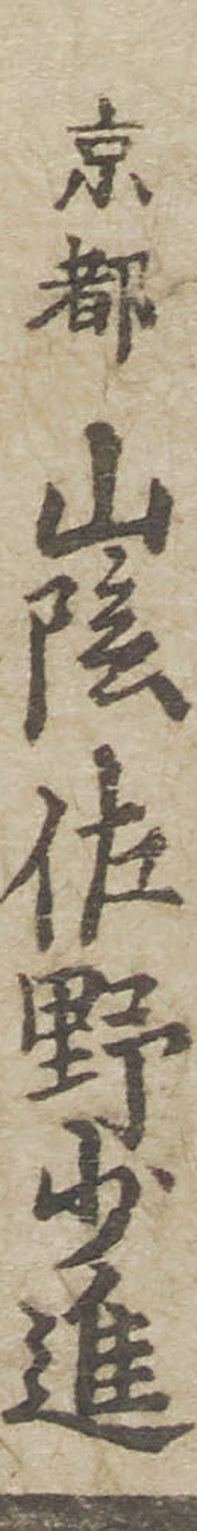同京都山陰佐野少進
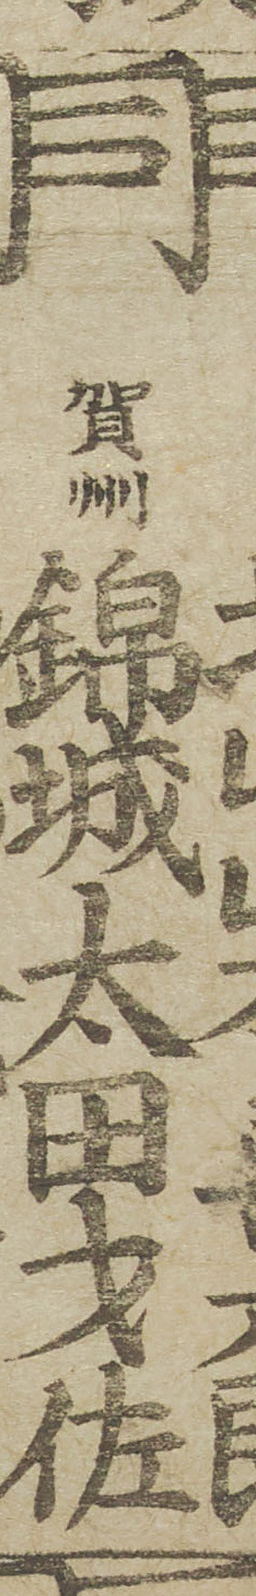同賀州錦城太田才佐
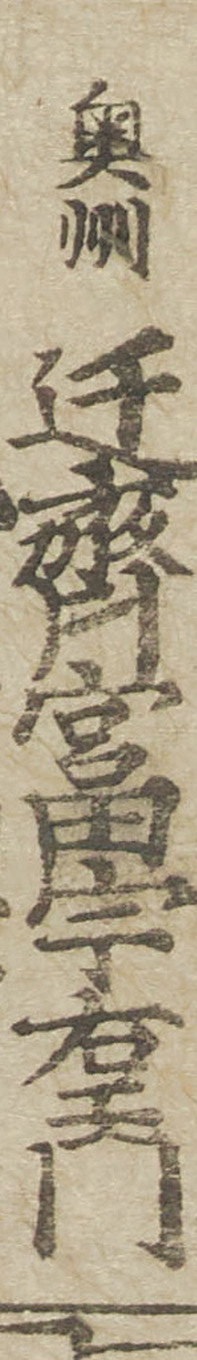同奥州迂斎宮田宇右エ門
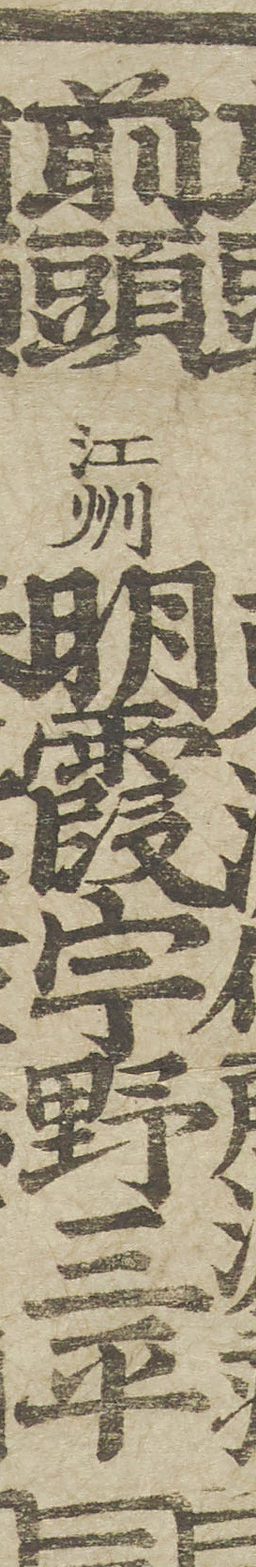前頭江州明霞宇野三平
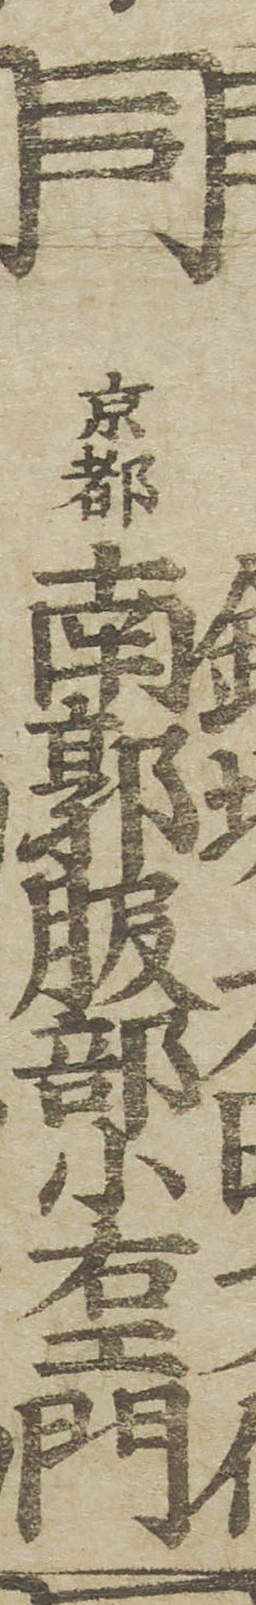同京都南郭服部小右エ門
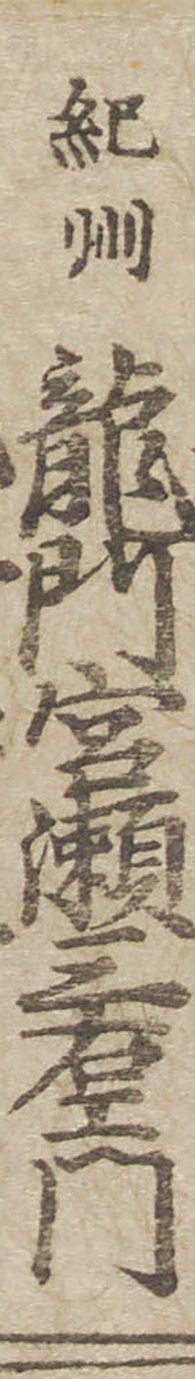同紀州龍門宮瀬三右エ門
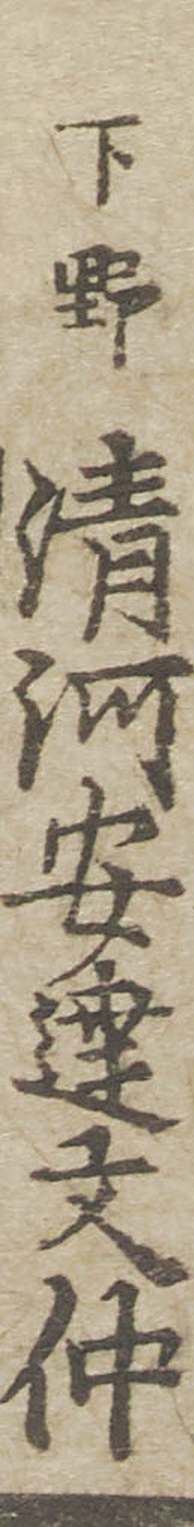同下野清河安達文仲
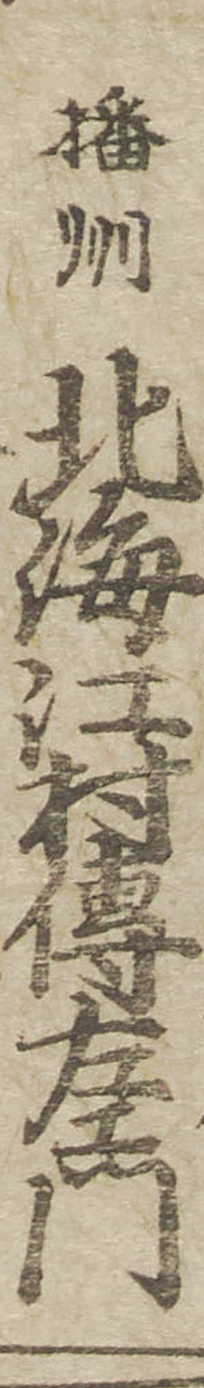同播州北海江村傳左エ門
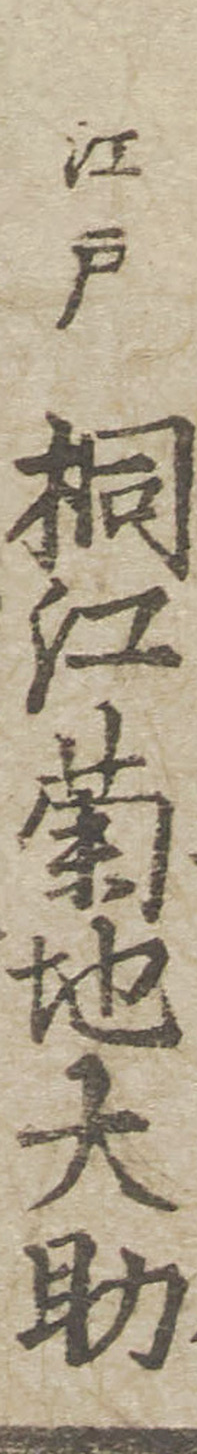同江戸桐江菊地大助
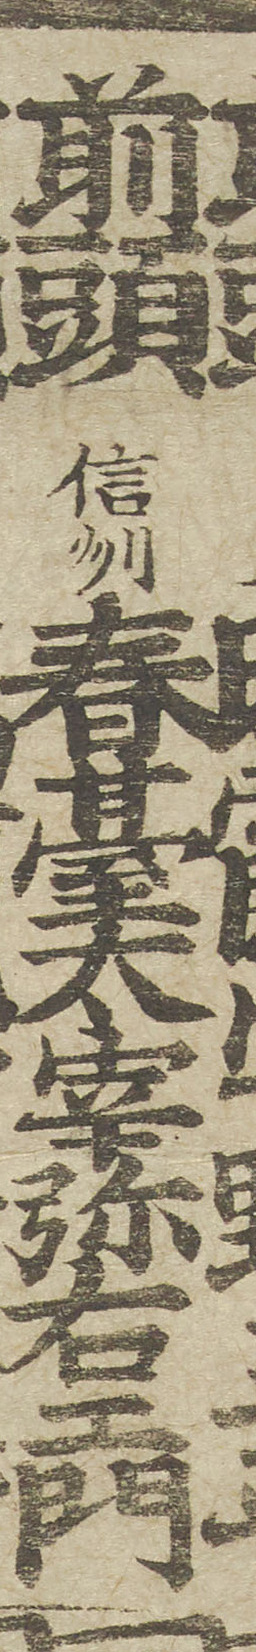前頭信州春臺太宰弥右エ門
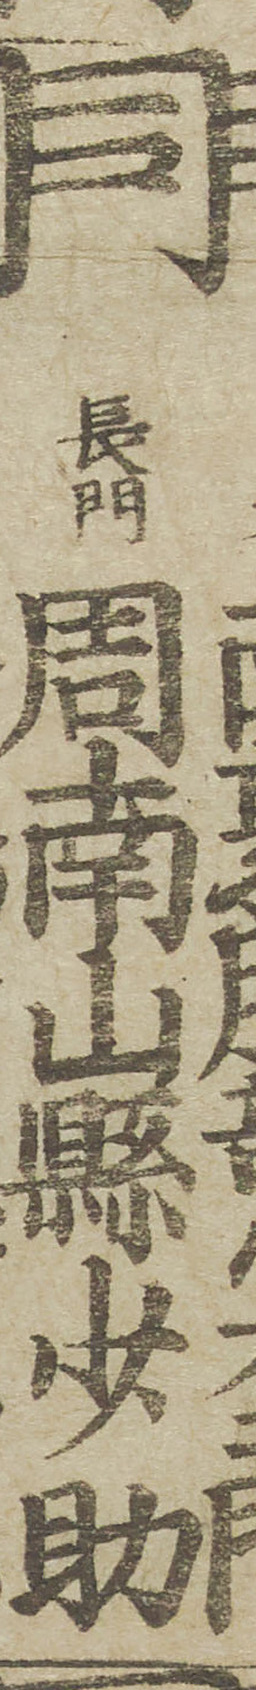同長門周南山縣少助
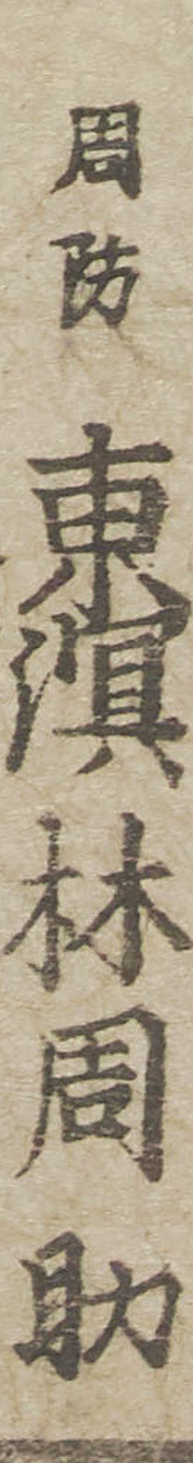同周防東溟林周助
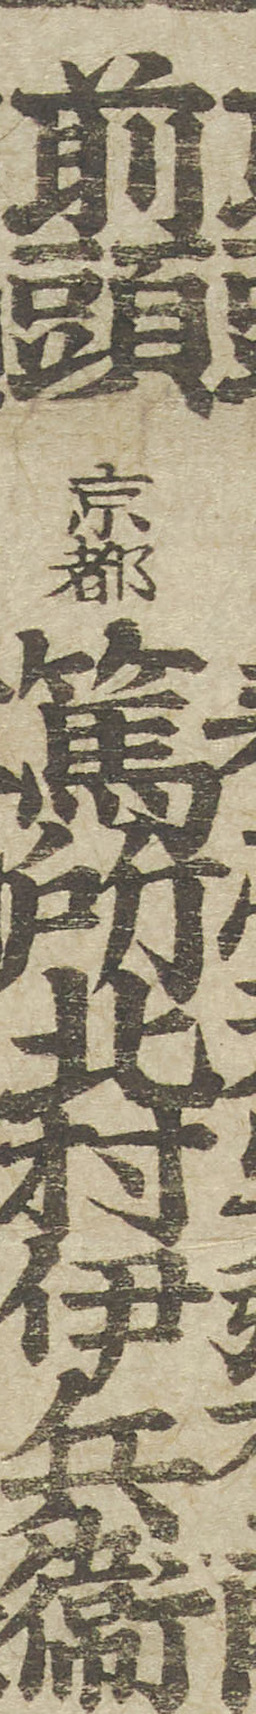前頭京都篤所北村伊兵衛
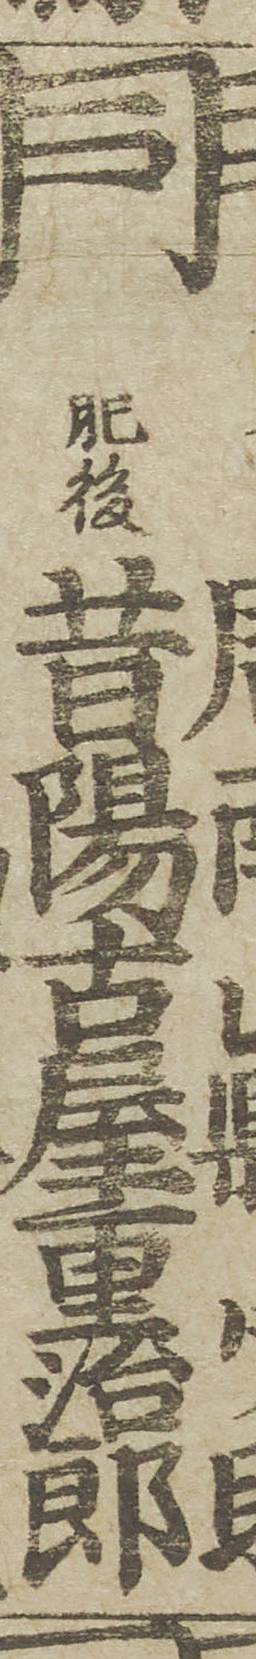同肥後昔陽古屋重治郎
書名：儒者競
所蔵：東京大学総合図書館 General Library in the University of Tokyo, JAPAN
